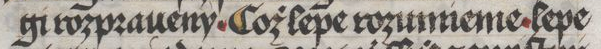gi rozpraueny.Coż lepe rozumieme.lepe
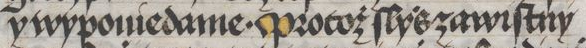y wypouiedame.Protož ſlyš zawiſtný
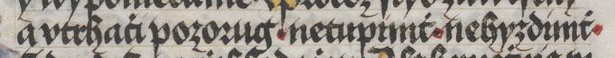á vtrhači pozorug.netupímiṫ.nehyzdímṫ.
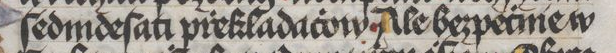ſedmdeſati pṙekladaċow.Ale bezpeċnie w
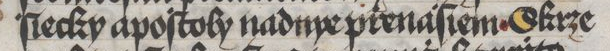ẛiecky apoẛtoly nadnye pṙenaẛiem.Skrze
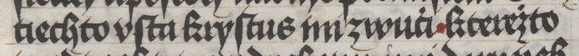tiechto vſta kryſtus mi zwuċí.ktereżto
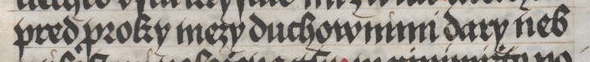preḋ ꝓroky mezy duchownimi dary neb
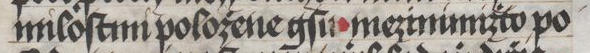miloſtmi polożene gſu.mezinímíżto po¬
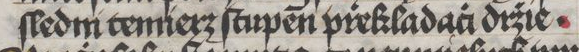ſlední temierz ſtupēn pṙekladaċi držie.
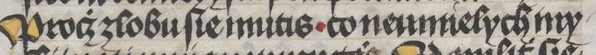Procż zlobu ſie muitis.co neumielych my¬
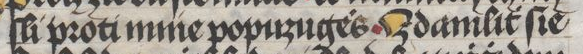ſlí protí mníe popurugeš.Zdaniliṫ ſie
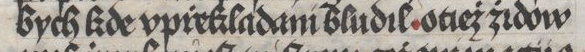bych kde vpṙekladaní bludil.otież żidow
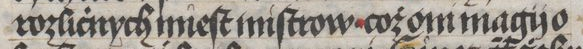rozliċnych mieſt miſtrow.coż oni magij o
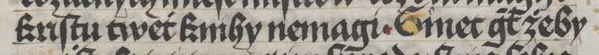kriſtu tweṫ knihy nemagí.Sinec ḡt żeby
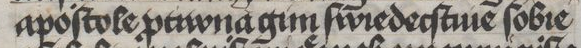apoẛtole ꝓtiwna gím ſwiedecſtuie ſobie
